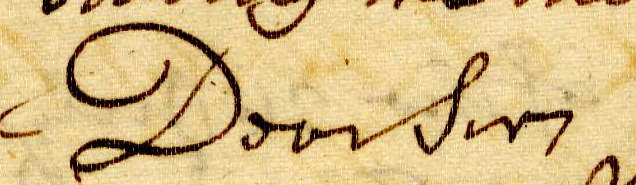Dear Sir
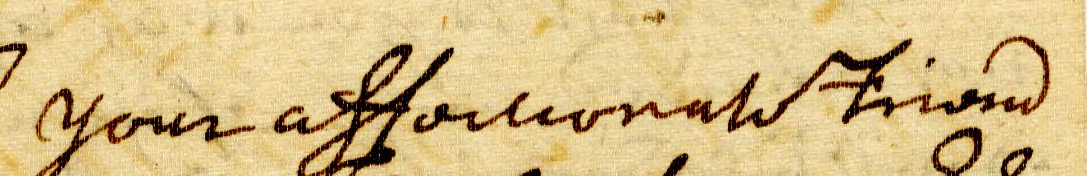your affectionate Friend
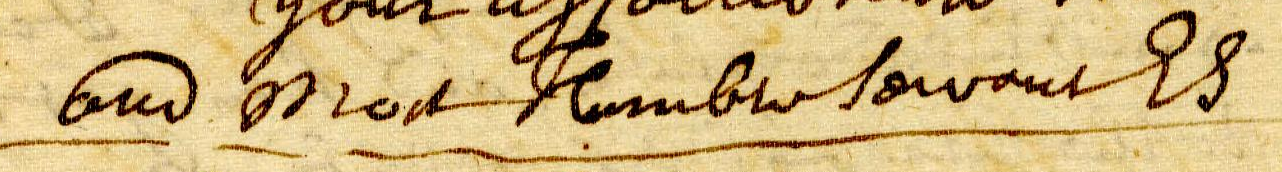and Most Humble Servant ES
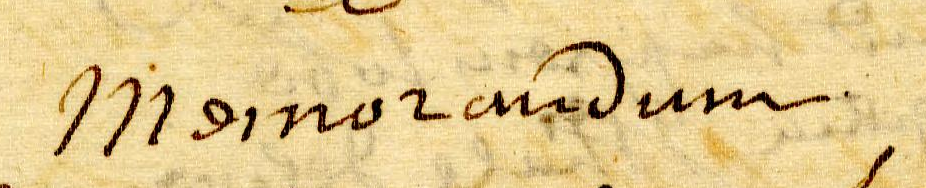Memorandum
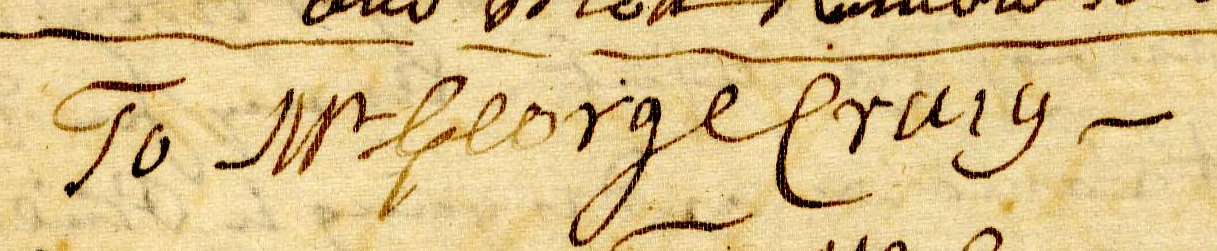To M^r George Craig-
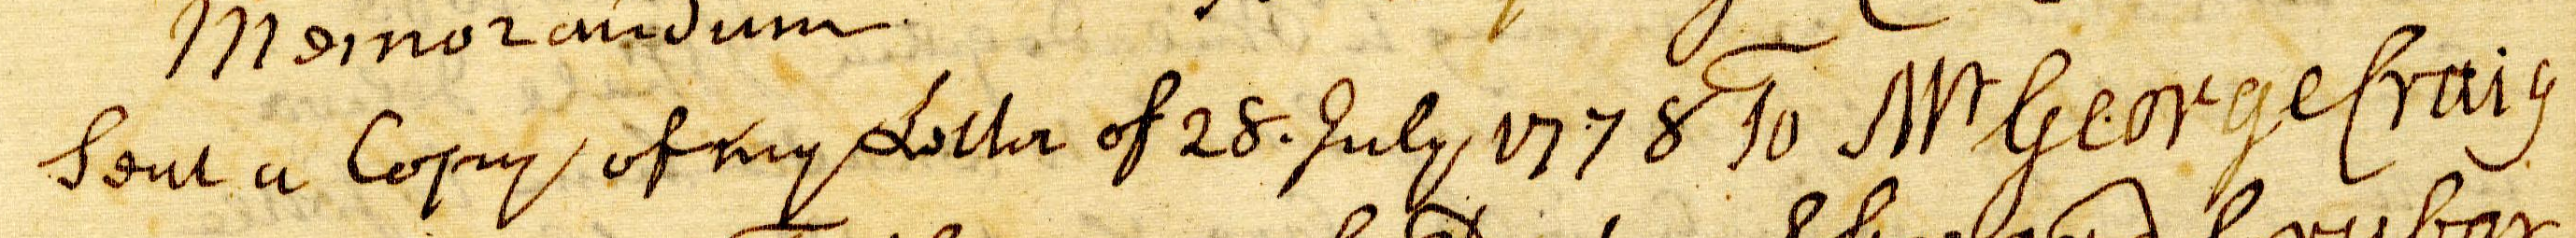Sent a Copy of my Letter of 28. July 1778 To M^r George Craig
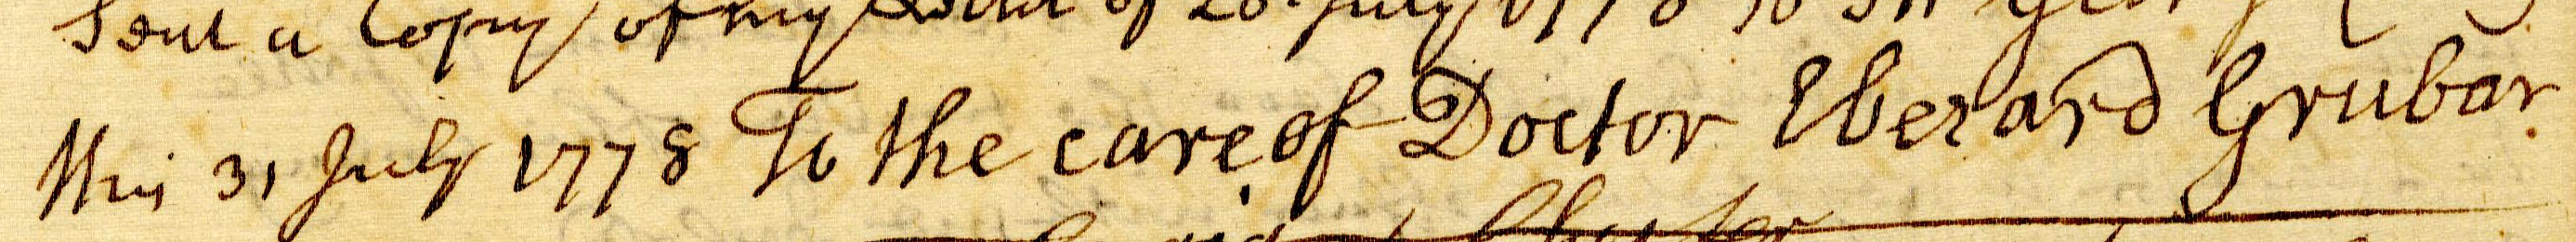this 31 July 1778 To the care of Doctor Eberard Grubar
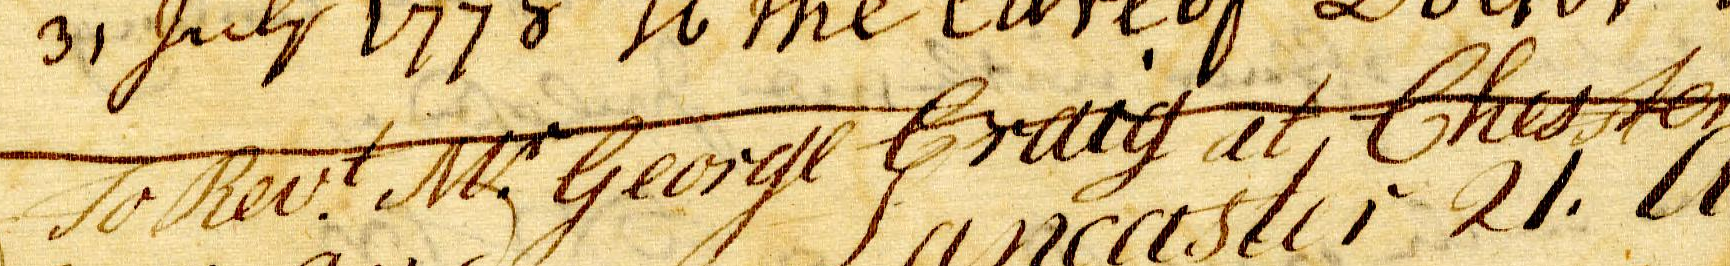To Rev^t. M^r. George Craig at Chester
